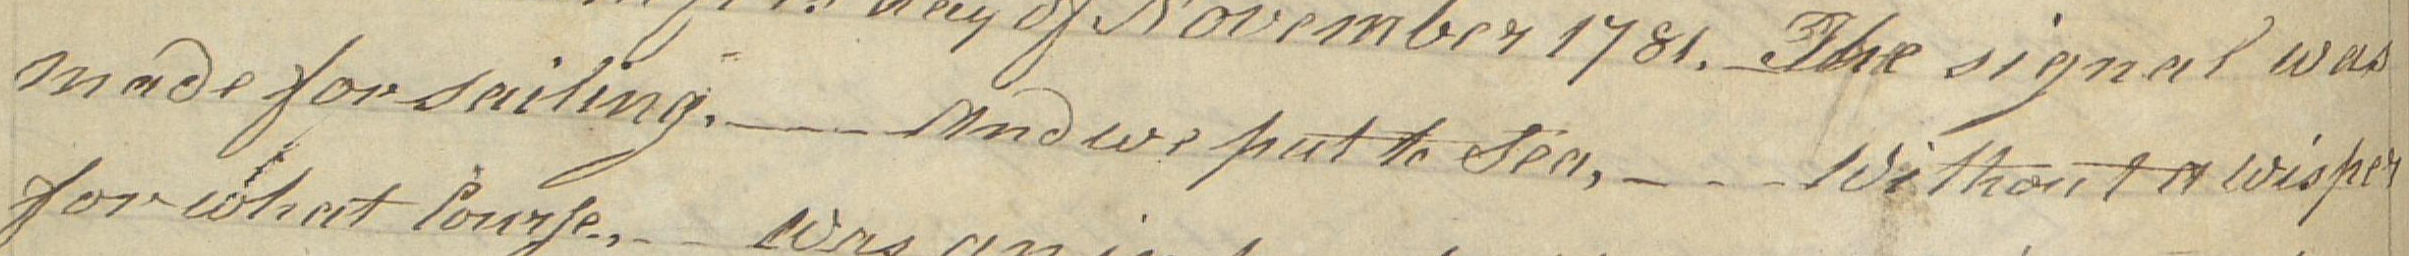made for sailing. and we put to sea, Without a Wisper
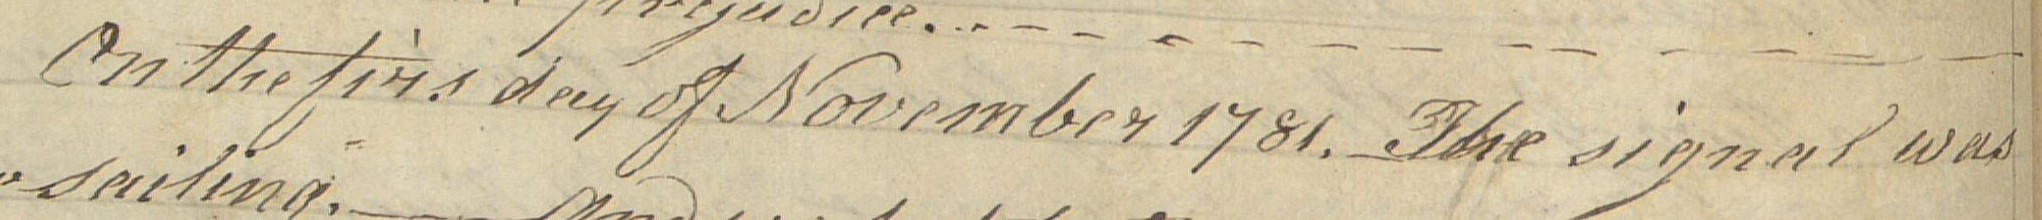On the firs day of November 1781. The signal was
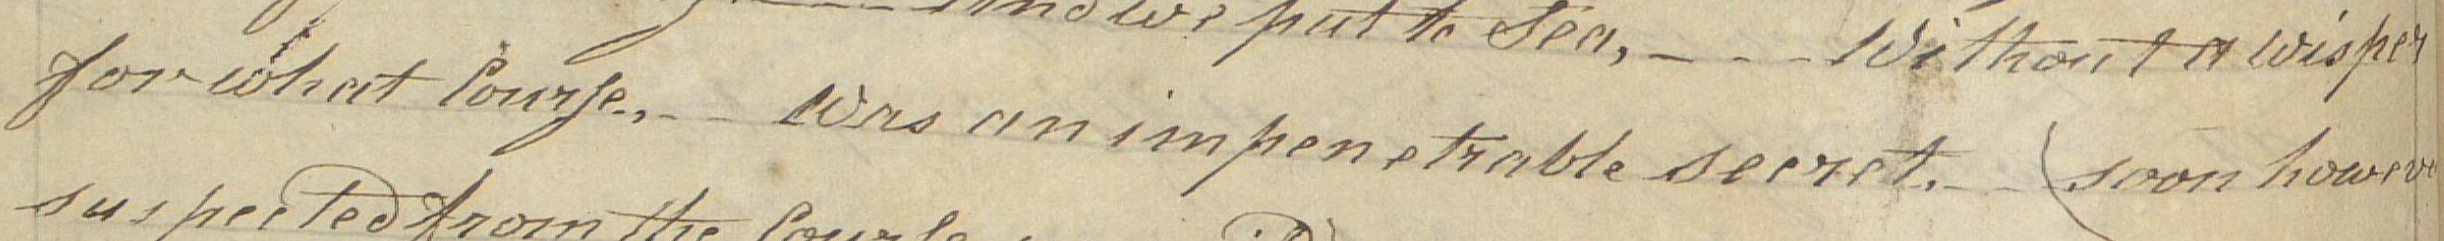for what Course, was an impenetrable secret. (soon however
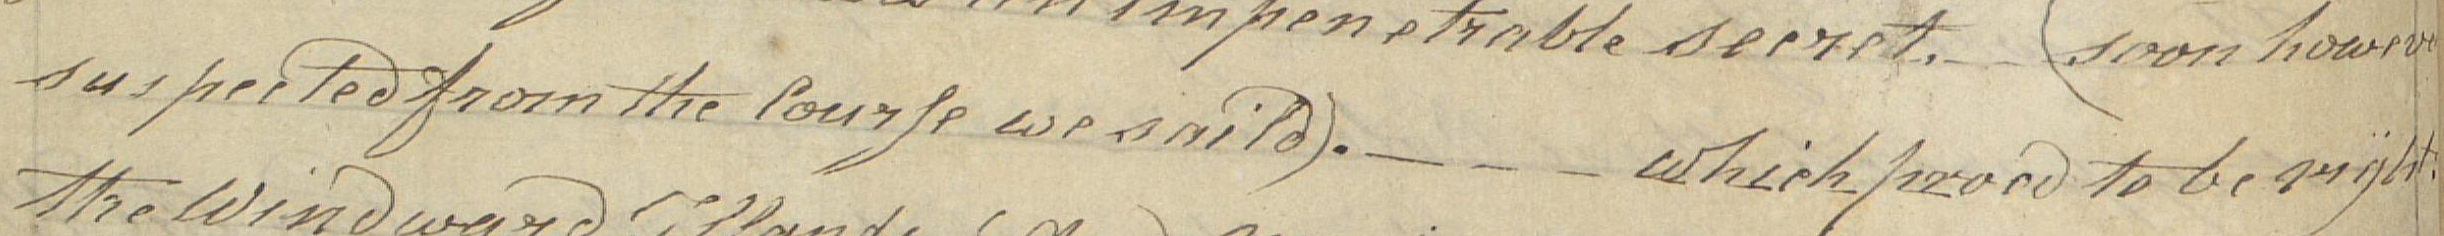suspected from the Course we saild). which provd to be right
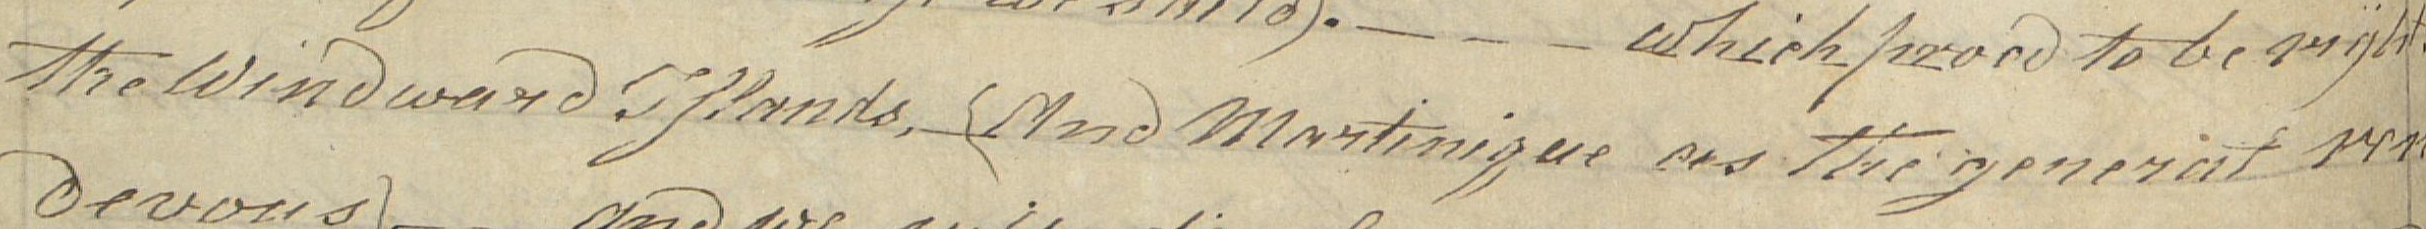the Windward Islands. (And Martinique as the general ren-
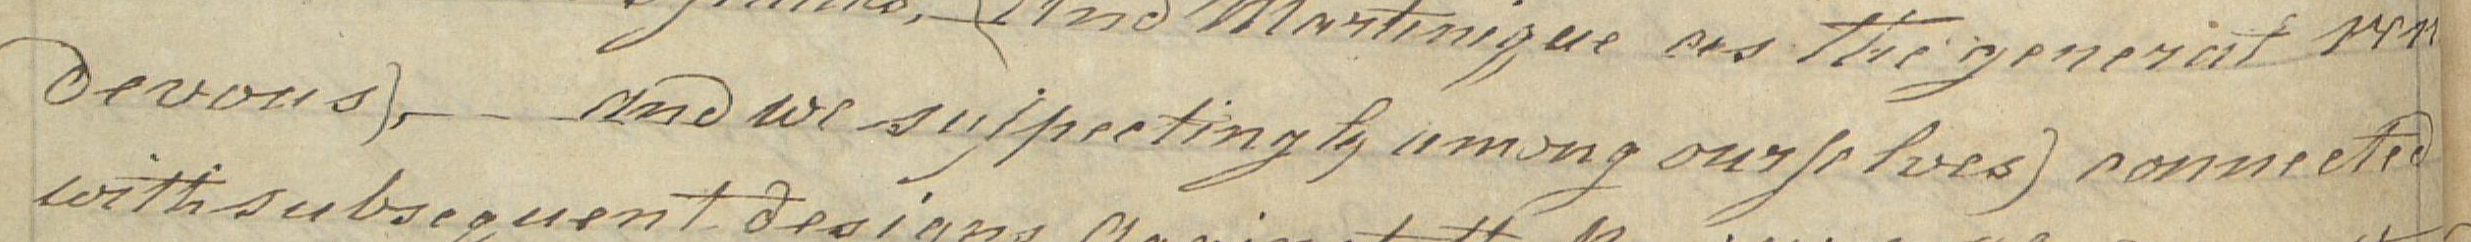-devous), And we suspectingly among ourselves) connected
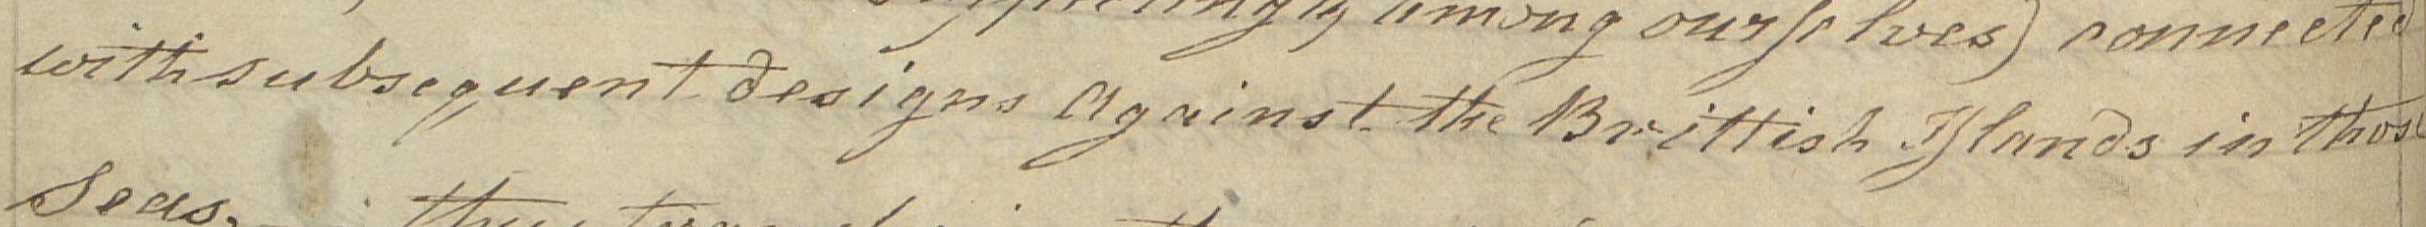with subsequent designs against the Brittish Islands in thos
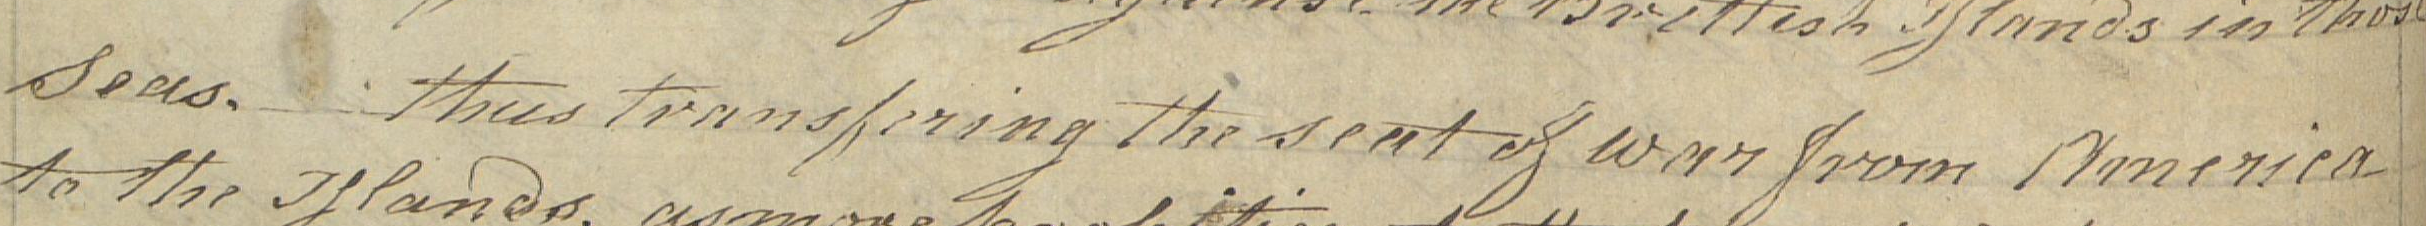Seas. Thus transferring the seat of war from America
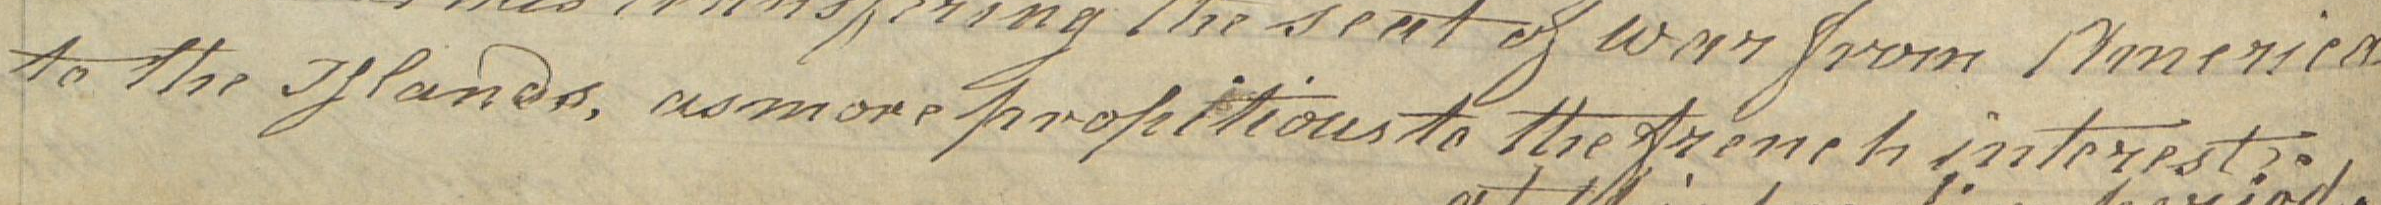to the Islands, as more propitious to the french interest:
